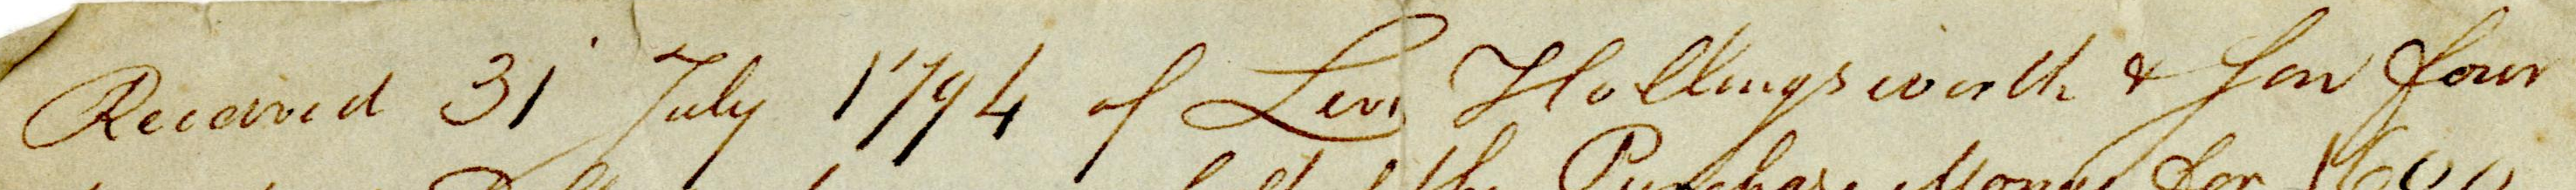Received 31 July 1794 of Levi Hollingsworth & for four
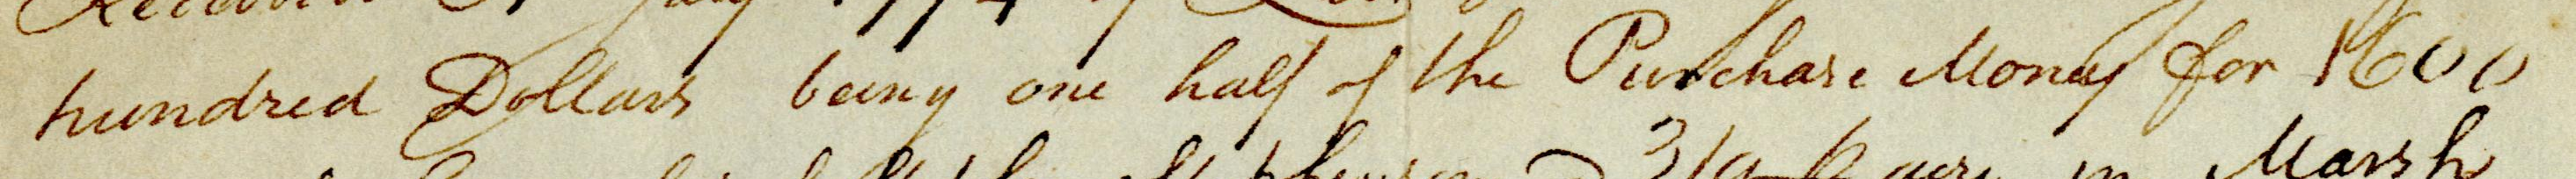hundred Dollars being one half of the Purchase Money for 1600
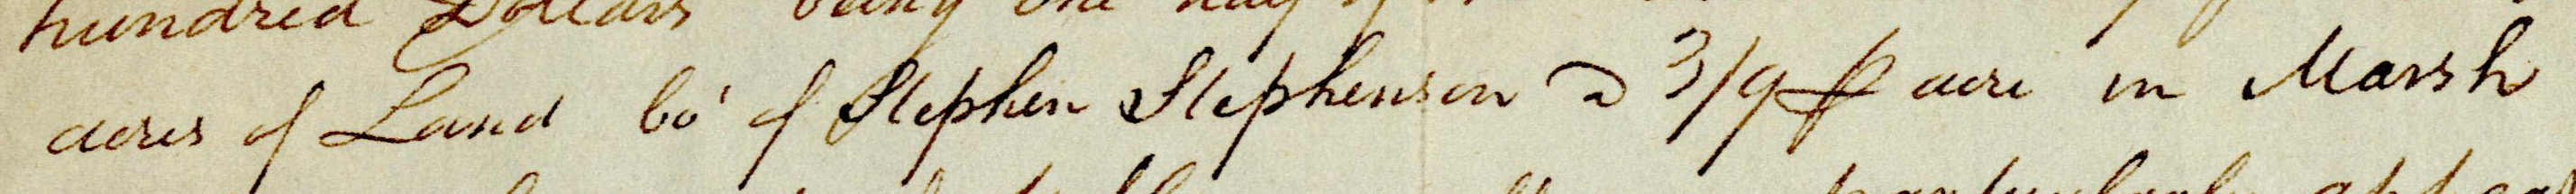acres of land bo' of Stephen Stephenson @ 3/9 per acre in Marsh
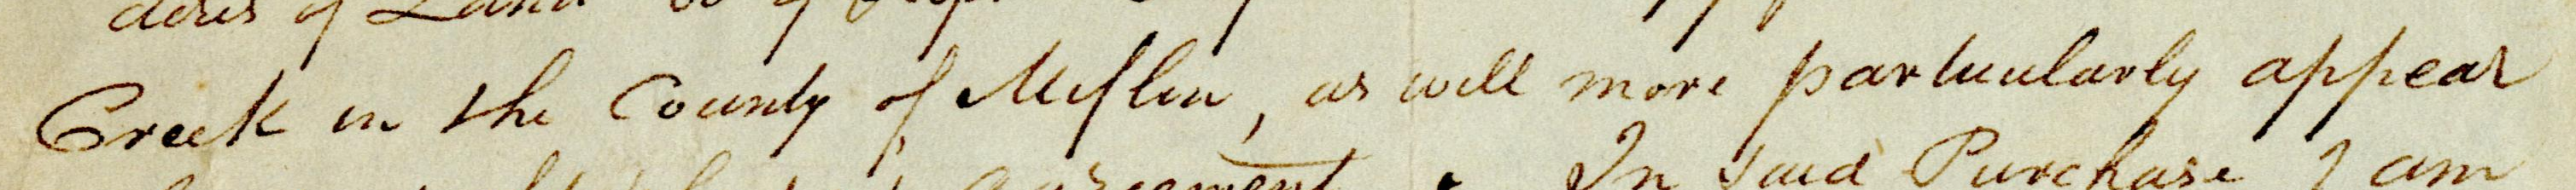Creek in the County of Miflin as well more particularly appear
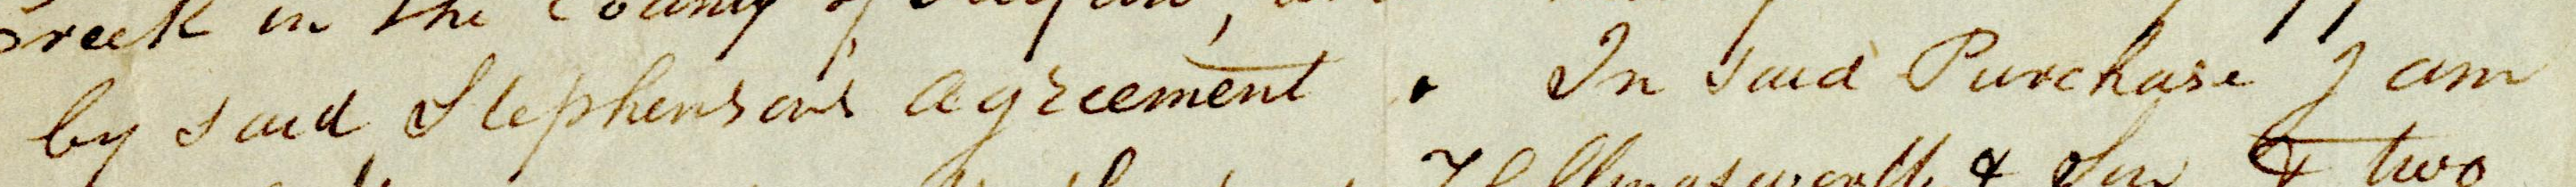by said Stephenson's agreement. In said Purchase I am
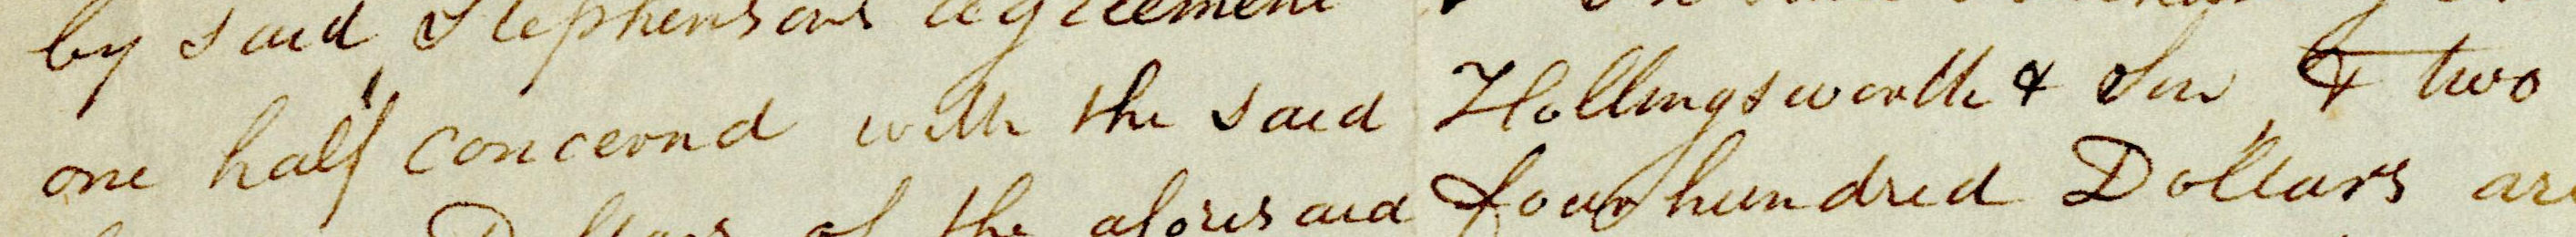one half concerned with the said Hollingsworth & Son & two
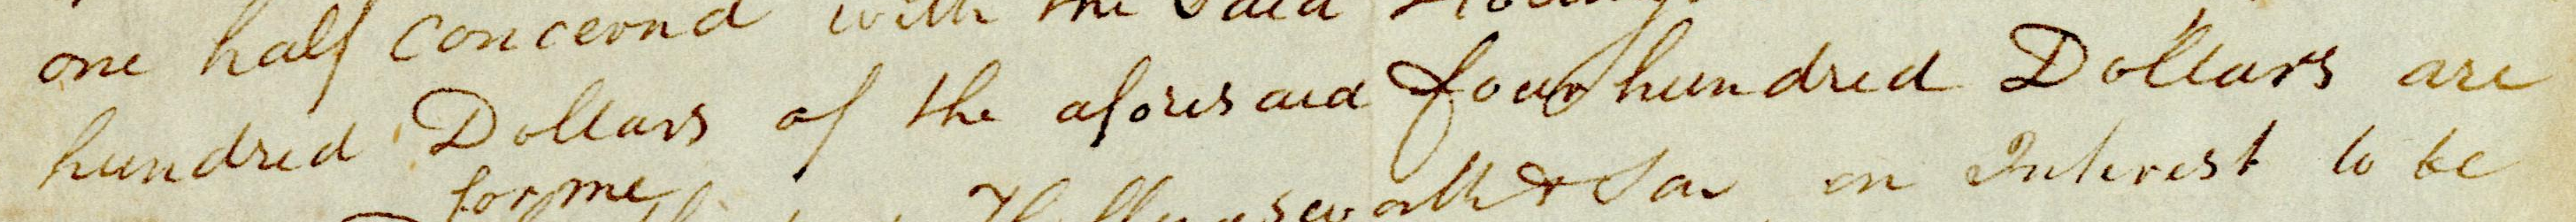hundred Dollars of the aforesaid four hundred Dollars are
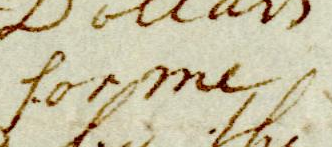for me
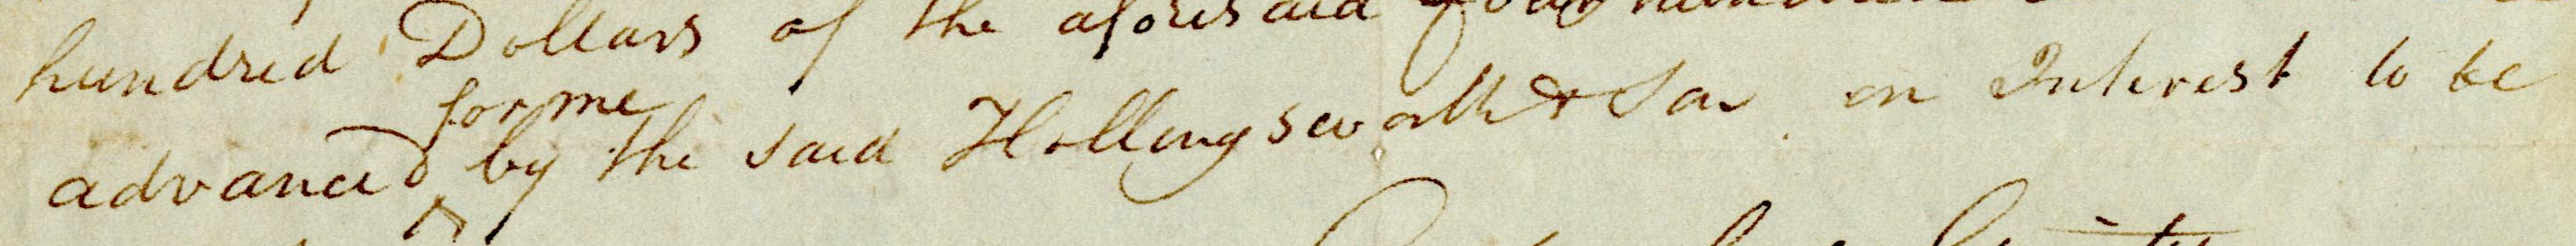advanced ^ by the said Hollingsworth & Son on Interest to be
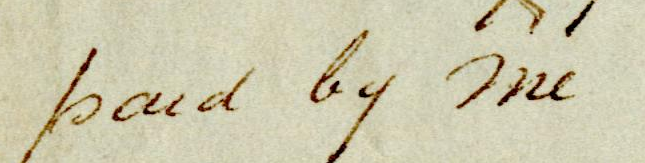paid by me
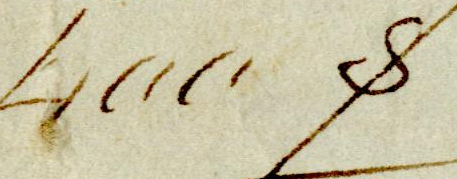400$
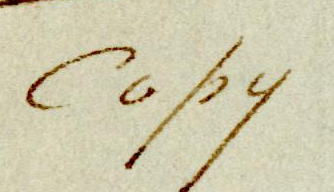Copy
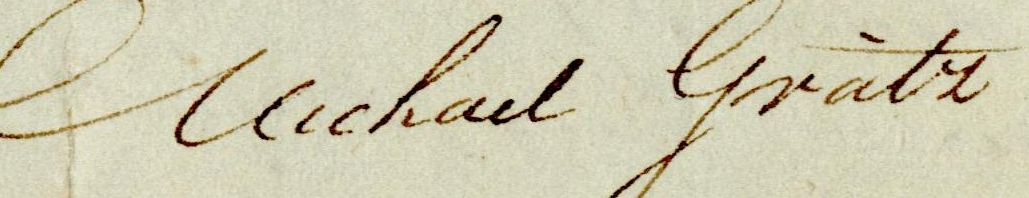Michael Gratz
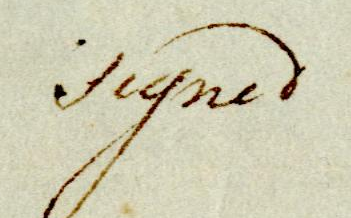signed
